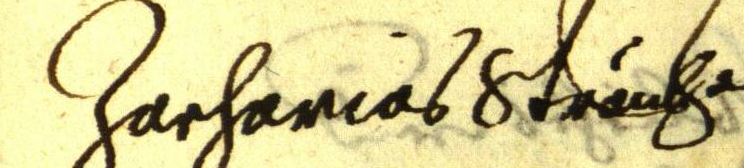Zacharias Straūb
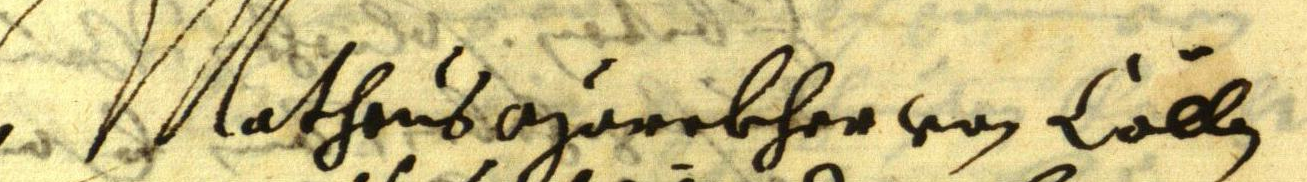Matheūs Mārckher von Cölln
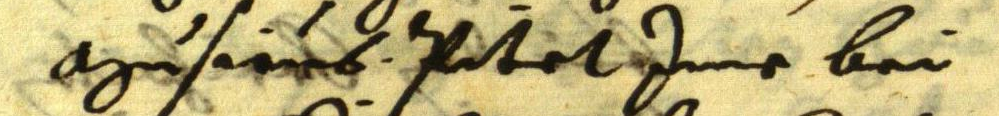Mūsicūs. Pitet Ime bei
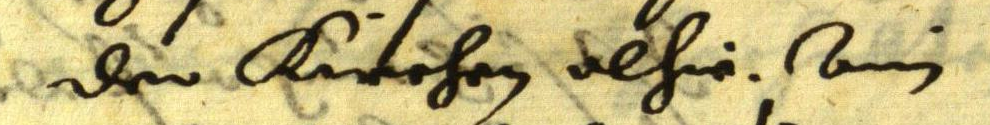der Kirchen alhie. Ain
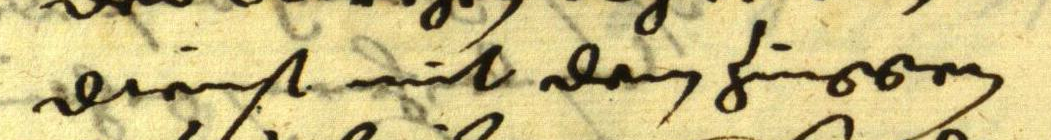dienst mit dem Zinggen
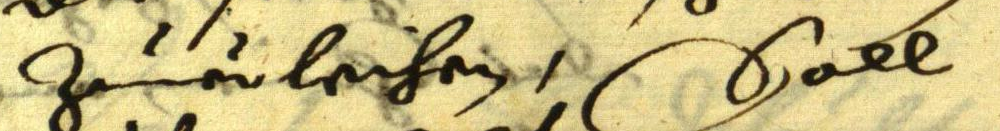Zūūerleihen, Soll
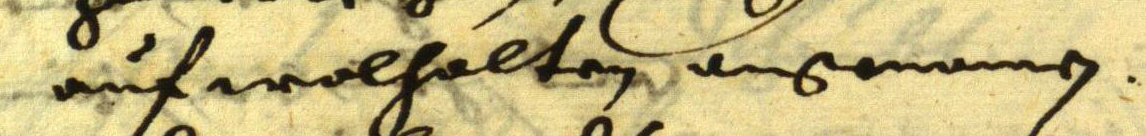aūf wolhalten angenomen.
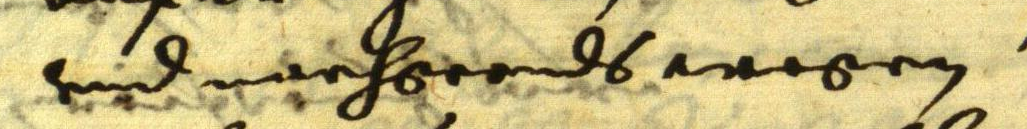vnd nachgeends wegen
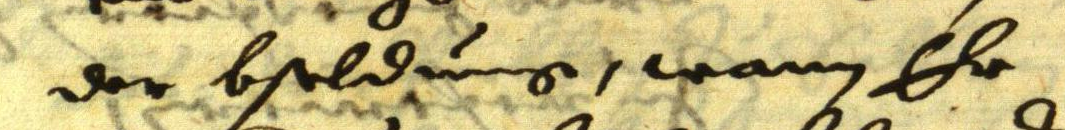der besoldūng, wann Er
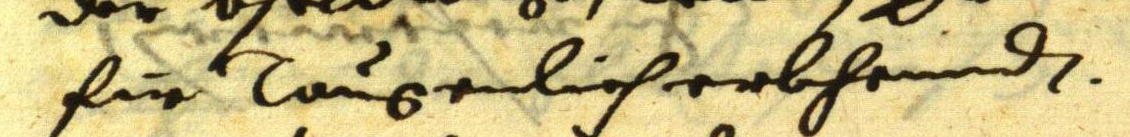fir Taūgenlich erkhenndt.
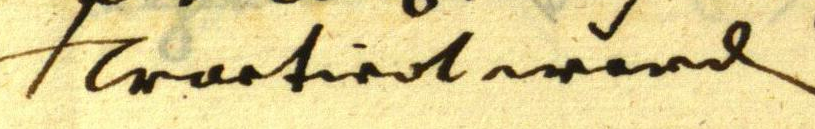Tractiert werd.
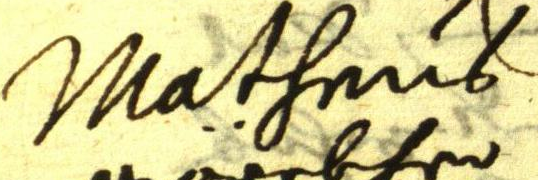Matheūs
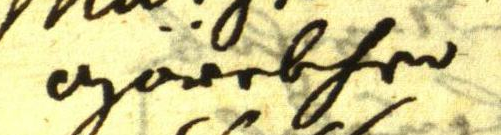Märckher
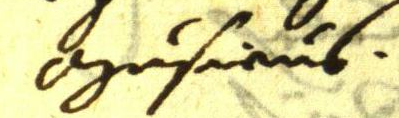Mūsicūs.
